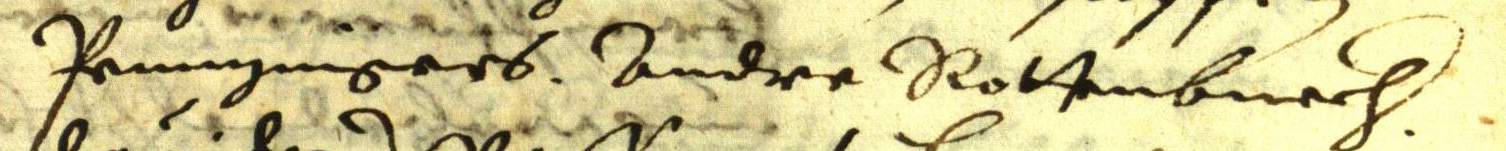Penntzingers. Andre Rottenbūech.
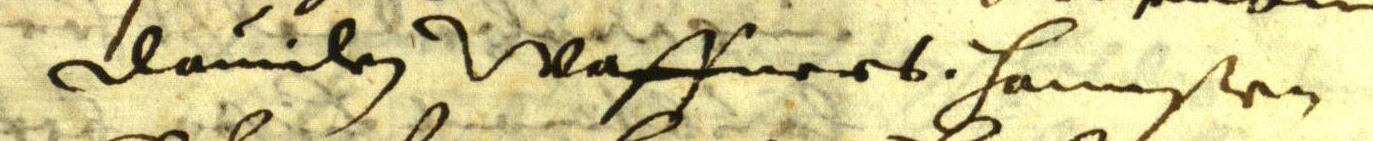Daūiden Waffners. hannsen
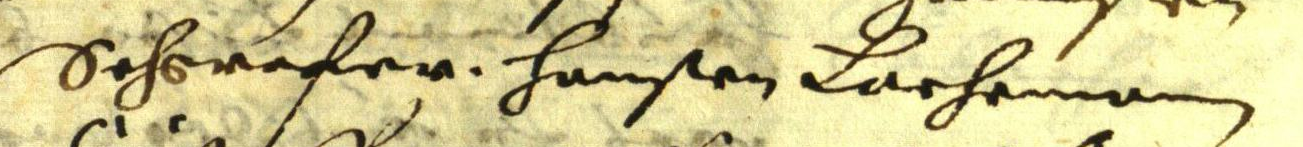Schgrafer. hansen Lochemann
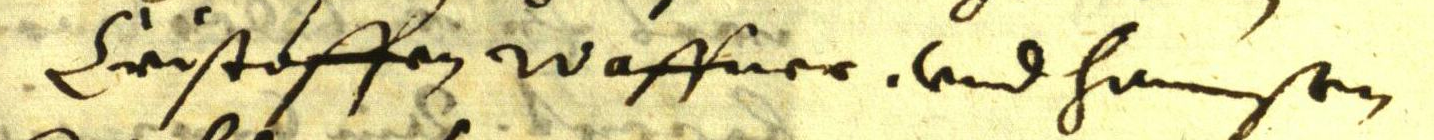Cristoffen Waffner. vnd hannsen
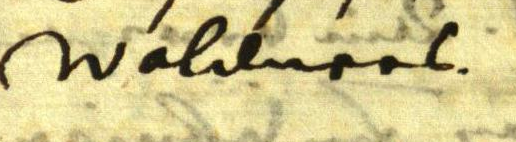Waldners.
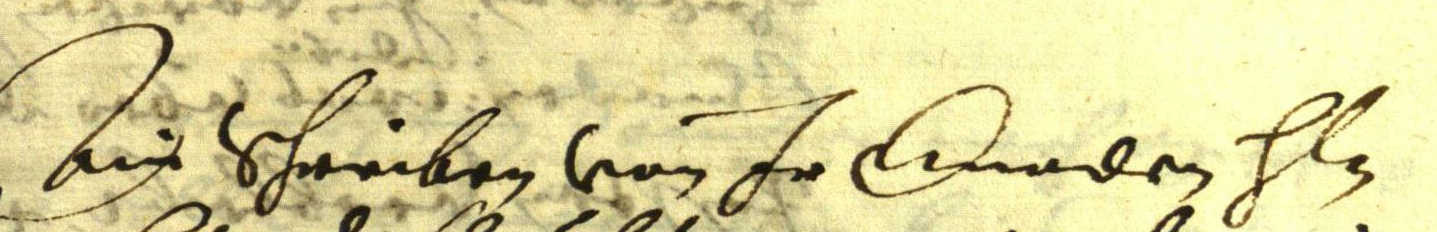Ain Schreiben von Ir Gnaden hln
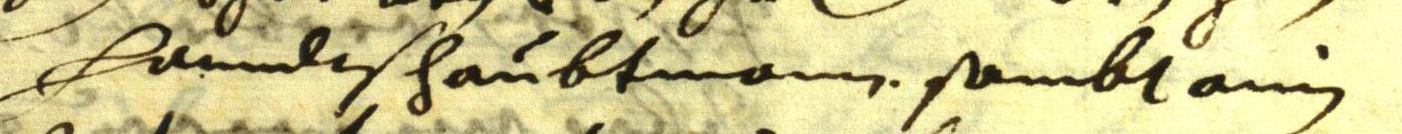Lanndtshaūbtmann. sambt aim
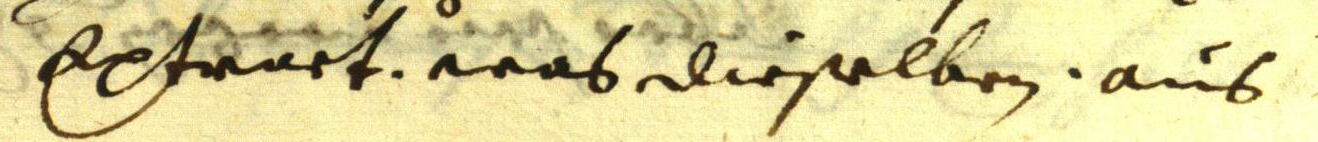Extract. was dieselben. aūs
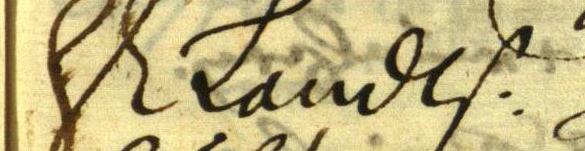Hl Landts¬
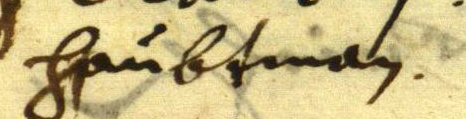haūbtman.
